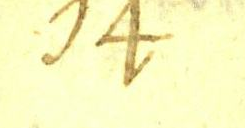14
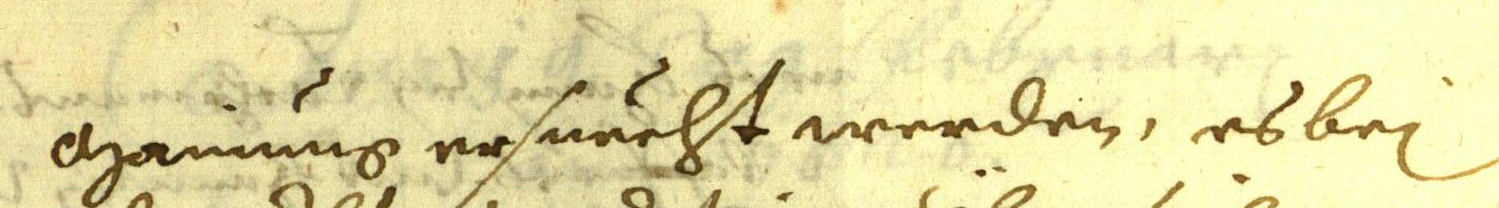Mainūng ersūecht werden, es bej
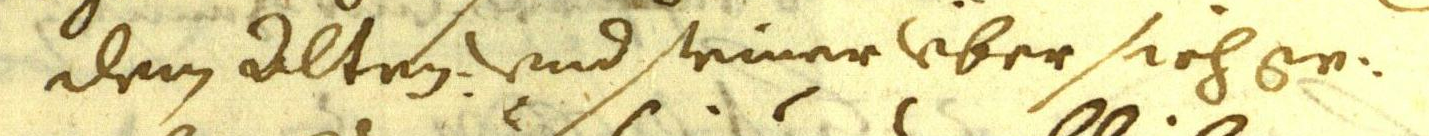dem Alten. vnd seiner v̈ber sich ge¬
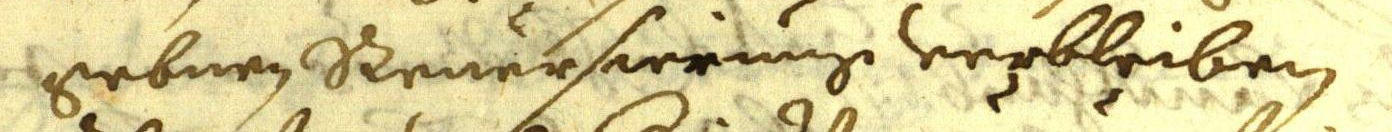gebnen Reūersierūng verbleiben
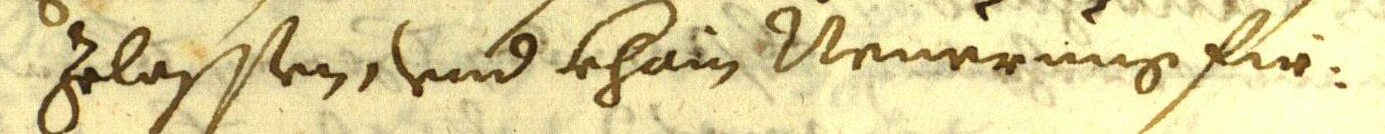Zelassen, vnd khain Neūerūng fir¬
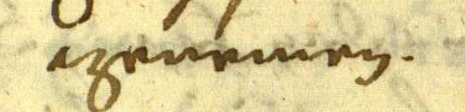zenemen.
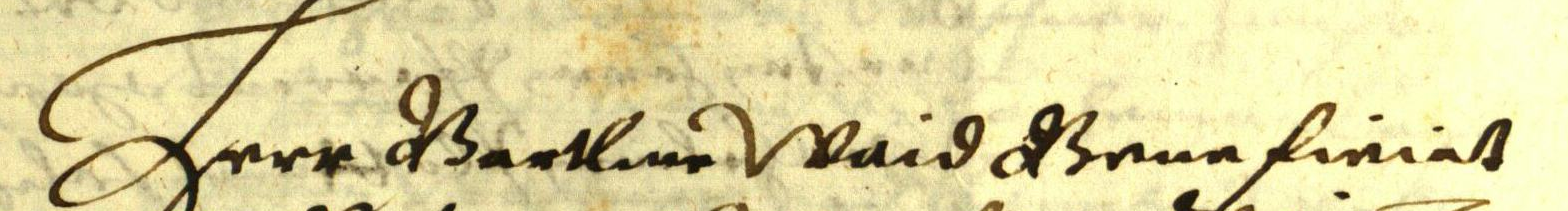Herr Bartlme Waid Beneficiat
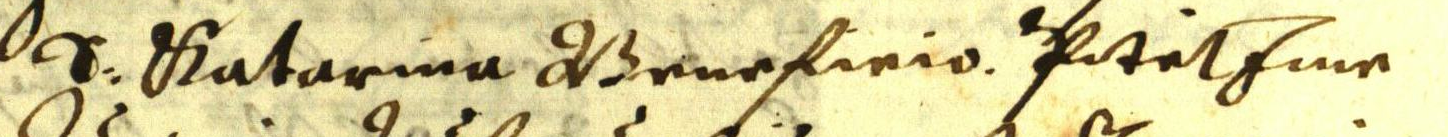S: Katarina Beneficio. Pitet Ime
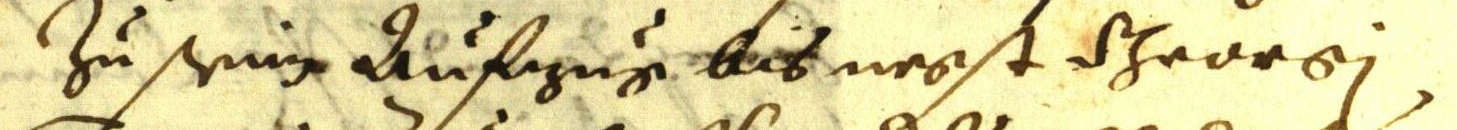Zū sein Aūfzūg bis negst Georgj
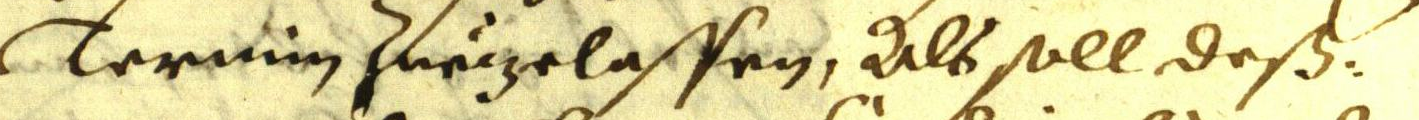Termin Zūezelassen, Als soll dess¬
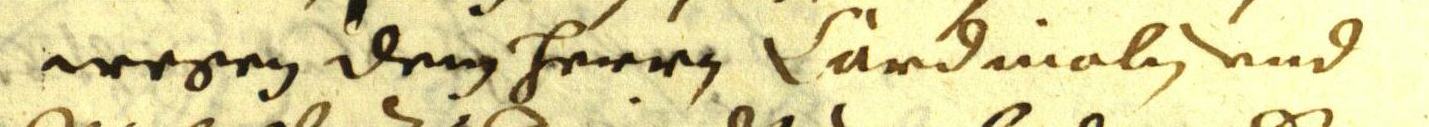wegen dem herrn Cardinaln vnd
